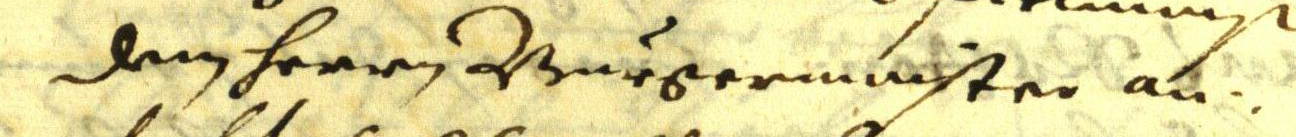den herrn Būrgermaister an¬
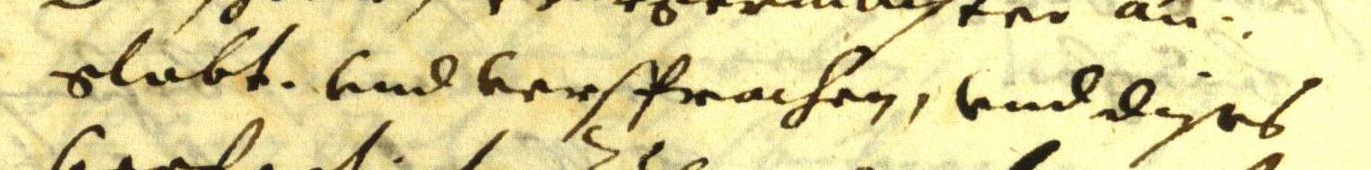globt. vnd versProchen, vnd dises
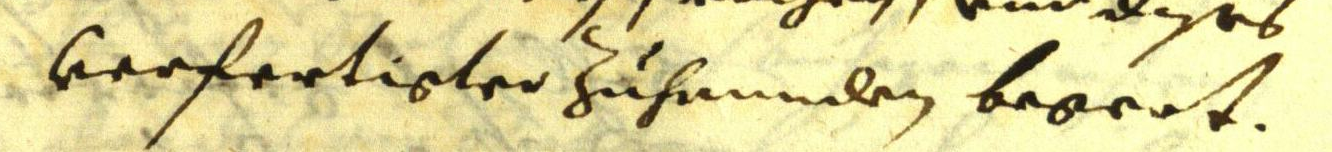verfertigter Zūhannden begert.
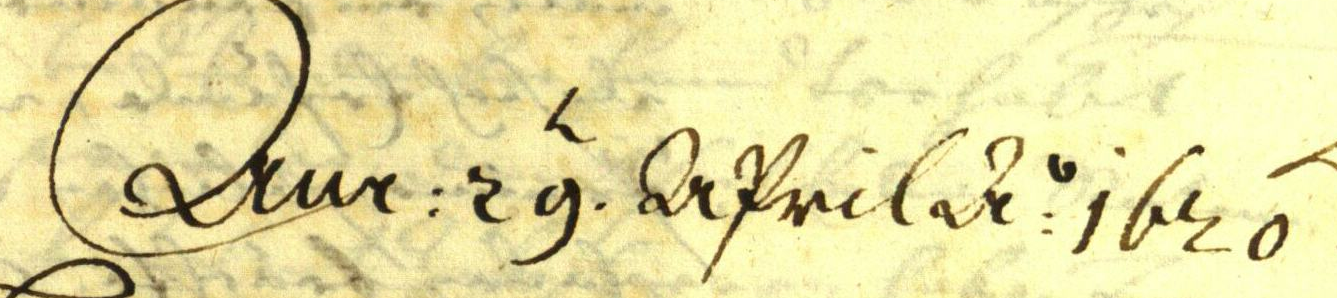Am: 29t. APril Ao: 1620t.
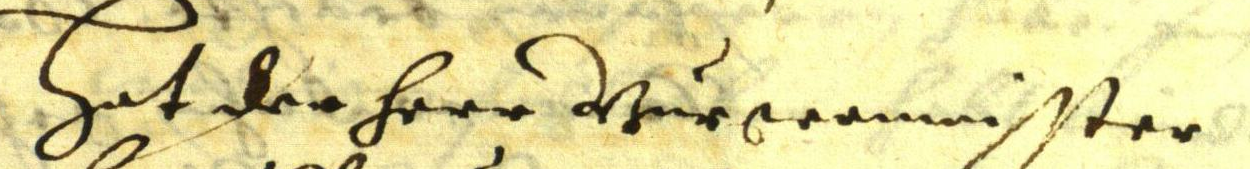Hat der herr Būrgermaisster
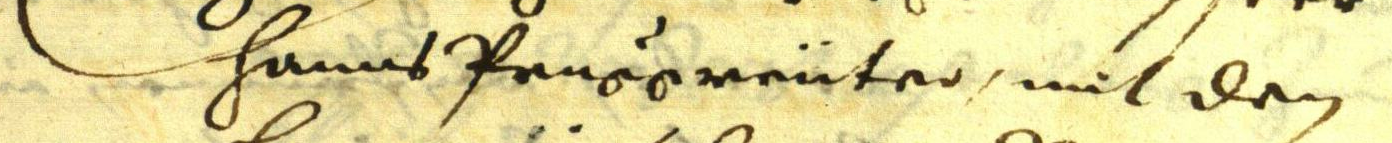hanns Prūggreüter, mit den
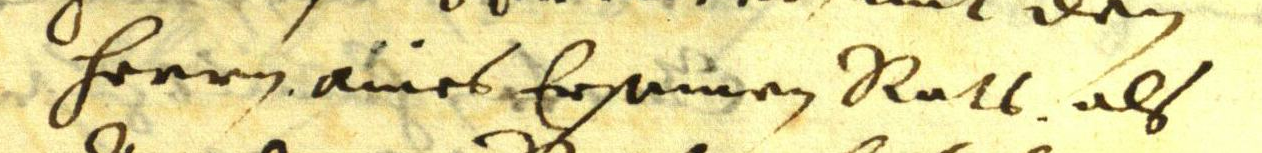herrn aines Ersamen Rats. als
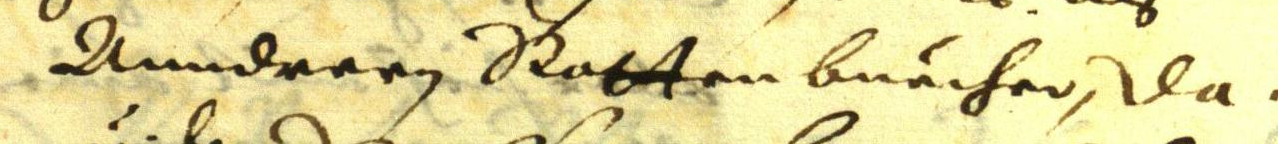Anndreen Rottenbūecher, Da¬
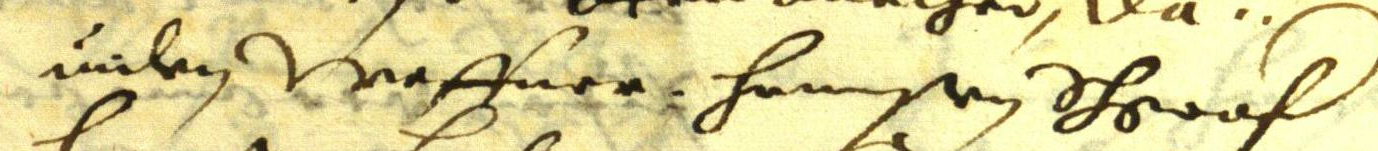ūiden Waffner. hannsen Schgraf.
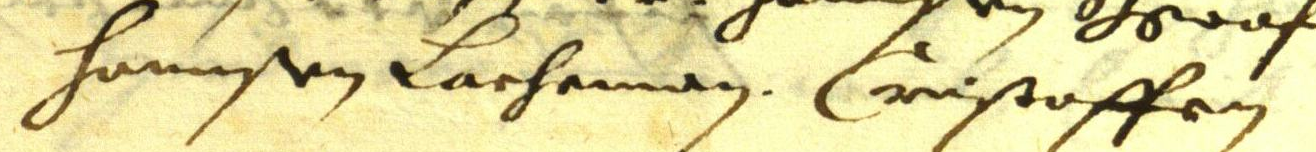hannsen Locheman. Cristoffen
